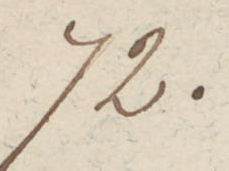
72.
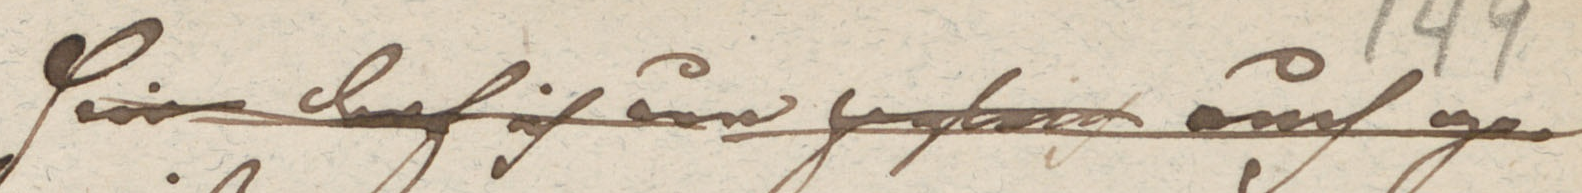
Hier darf ich nun zugleich auch ge-
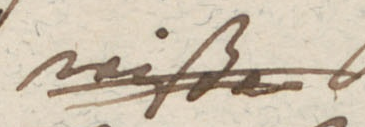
wisse
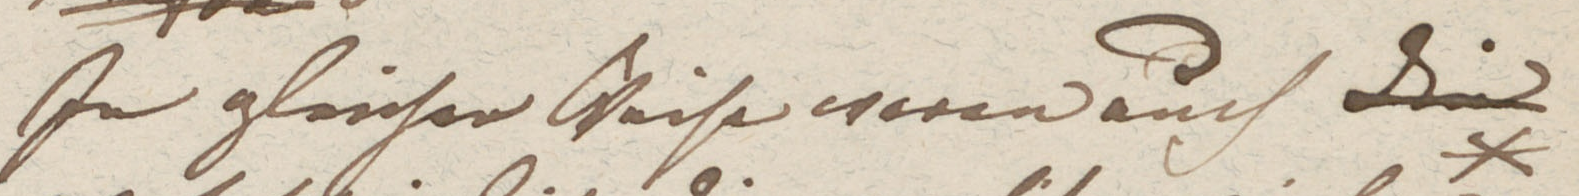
In gleicher Weise waren auch die
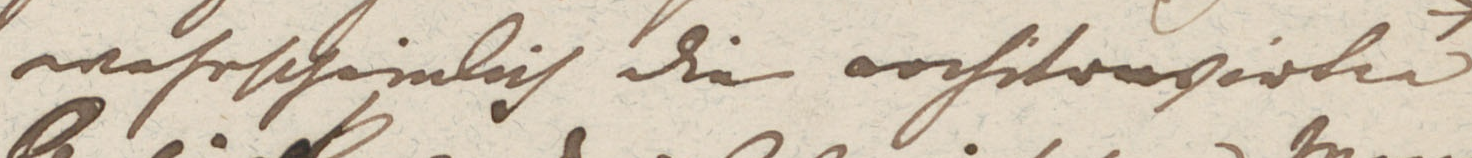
wahrscheinlich die architravirten %
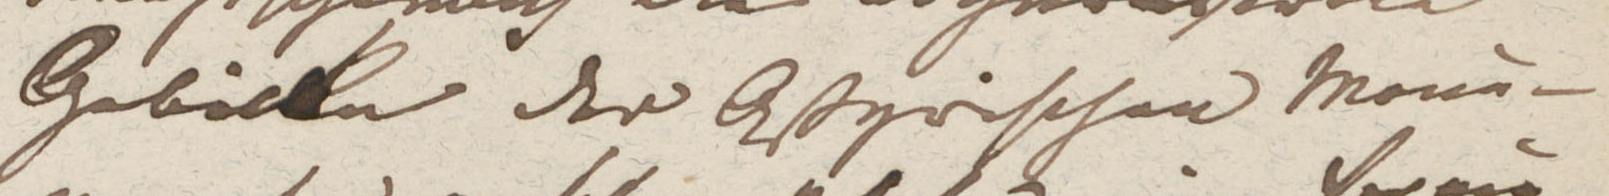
Gebälke der Assyrischen Monu-
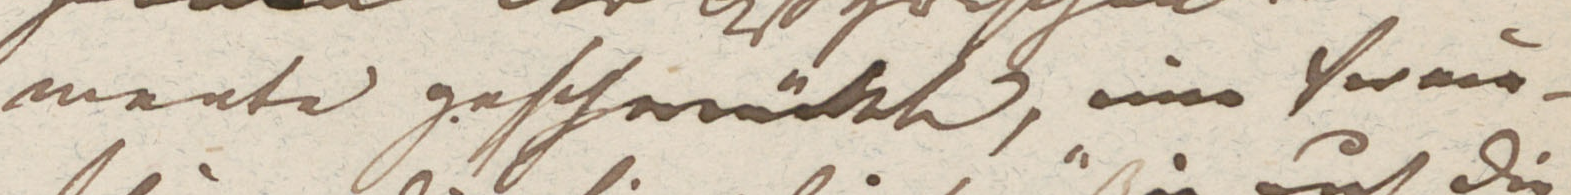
mente geschmückt, eine Vermu-
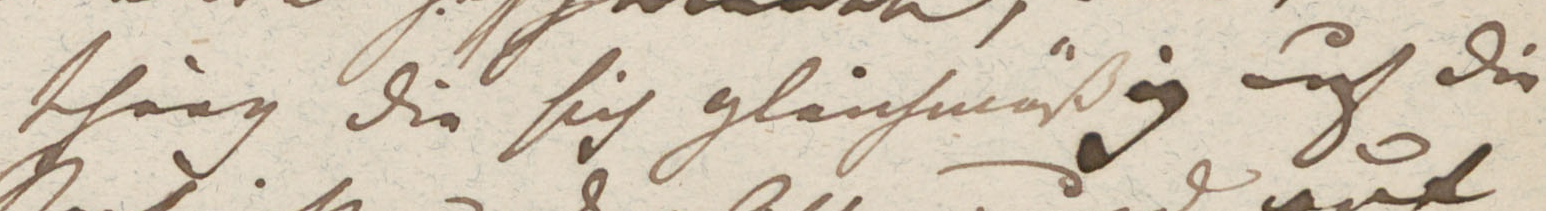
thung die sich gleichmässig auf die
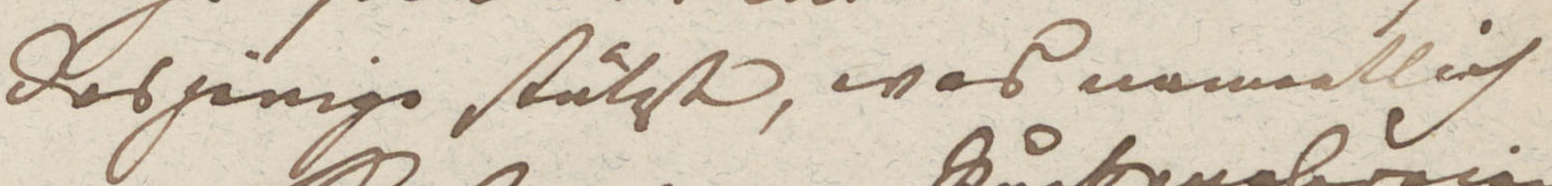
dasjenige stützt, was namentlich
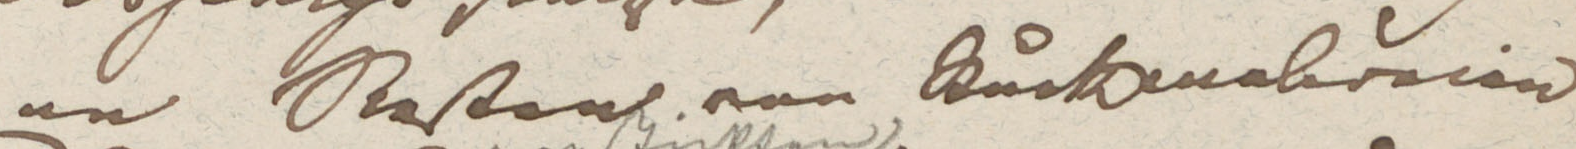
an Resten von Stuckmalereien
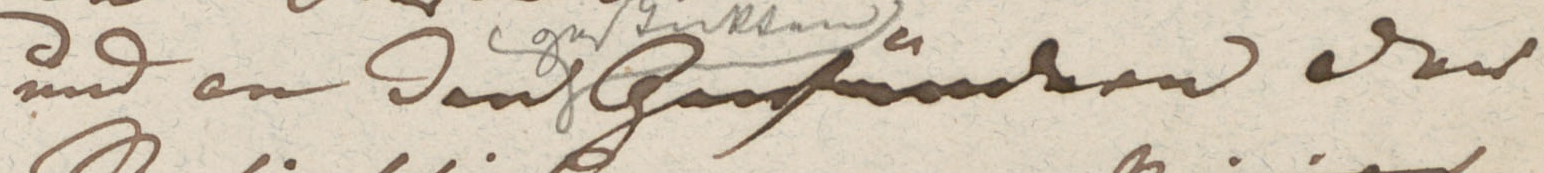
und an den gestickten Gewändern der
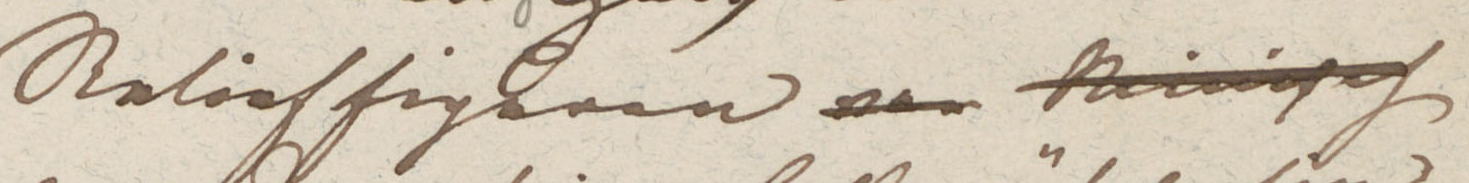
Relieffiguren von Niniveh
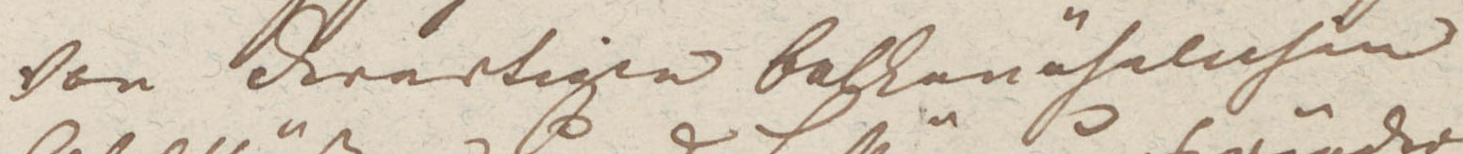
von derartigen balkenähnlichen
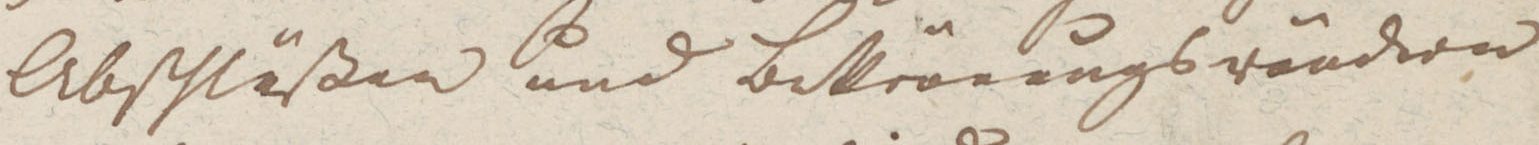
Abschlüssen und Bekrönungsrändern
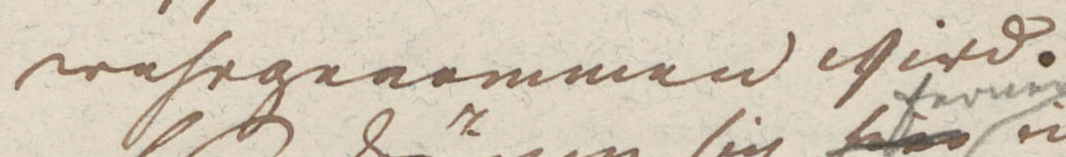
wahrgenommen wird.
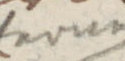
architectonische
